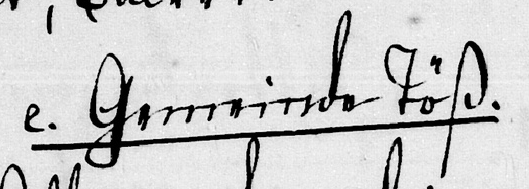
e. Gemeinde Töß
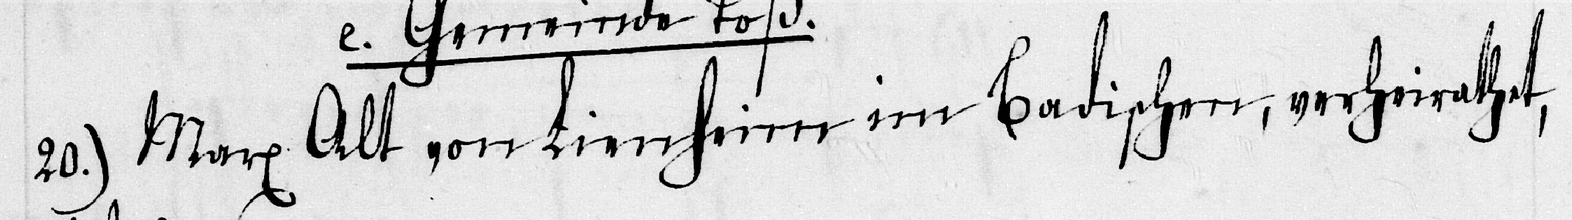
20.) Marx Alt von Lienheim im Badischen, verheirathet,
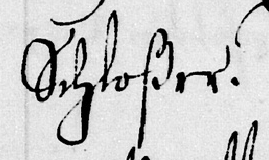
Schloßer.
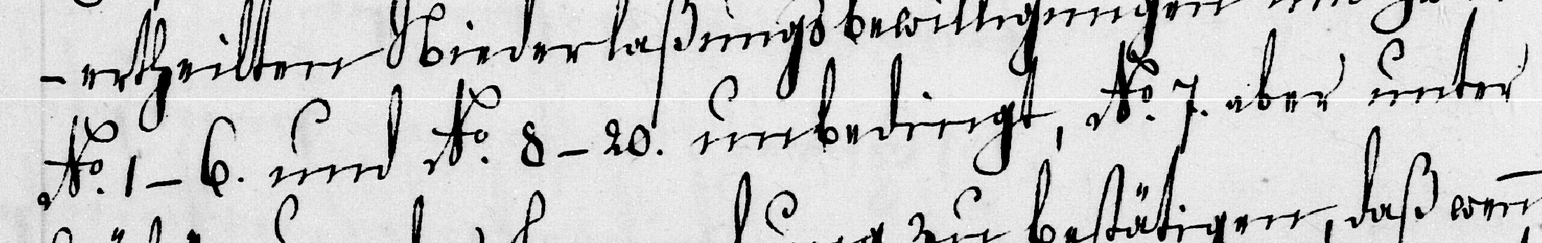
No. 1–6. und No. 8–20. unbedingt, No. 7. aber unter
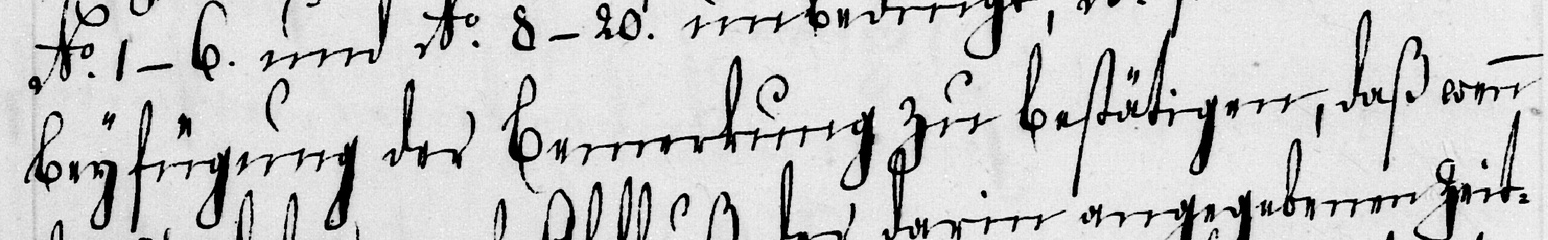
Beyfügung der Bemerkung zu bestätigen, daß wen¬
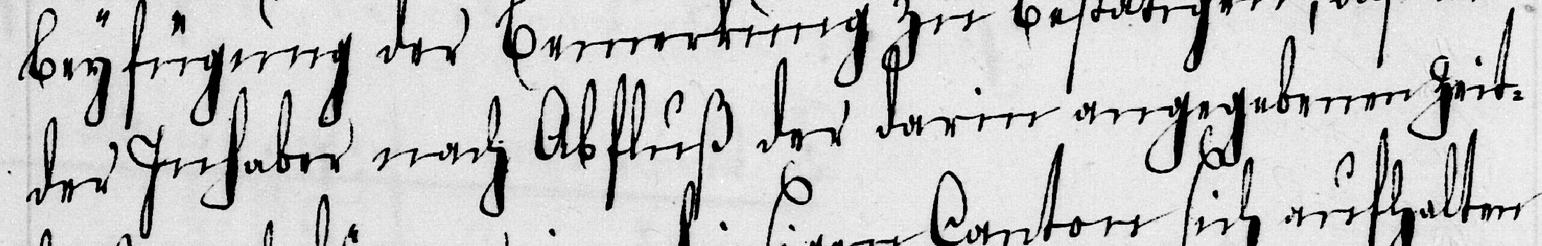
der Inhaber nach Abfluß der darin angegebenen Zeit¬
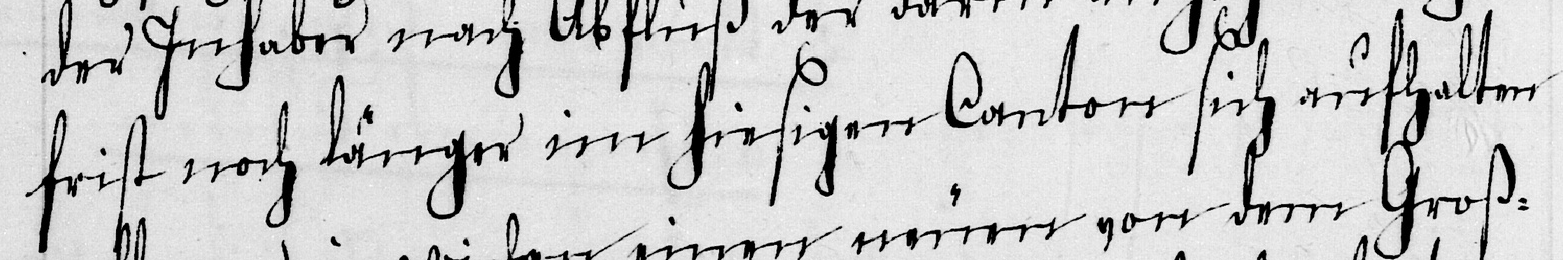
frist noch länger im hiesigen Canton sich aufhalten
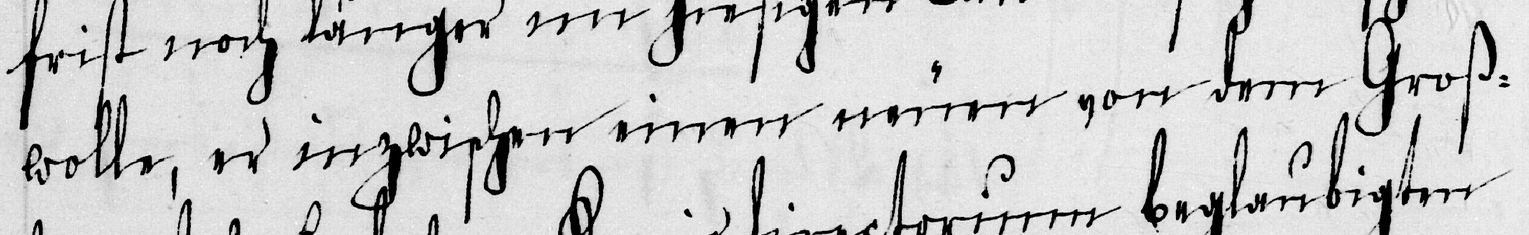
wolle, er inzwischen einen neuen von dem Groß¬
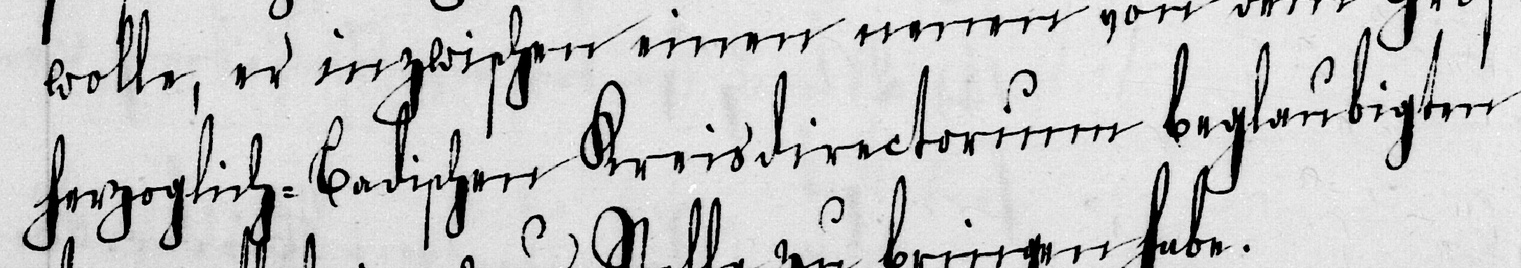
herzoglich-Badischen Kreisdirectorium beglaubigten
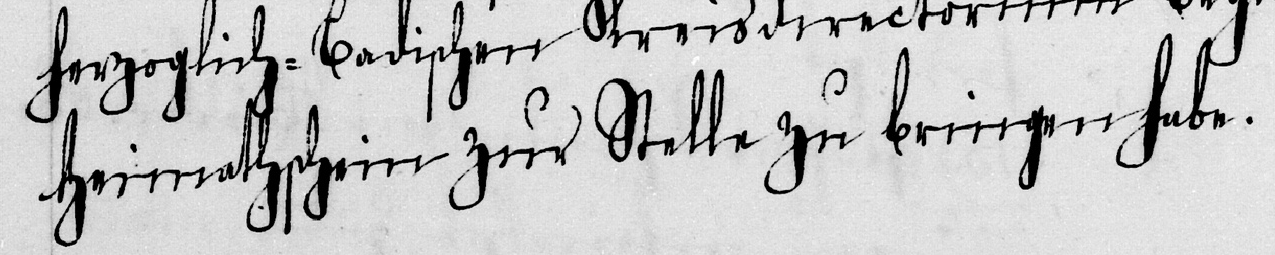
Heimathschein zur Stelle zu bringen habe.
